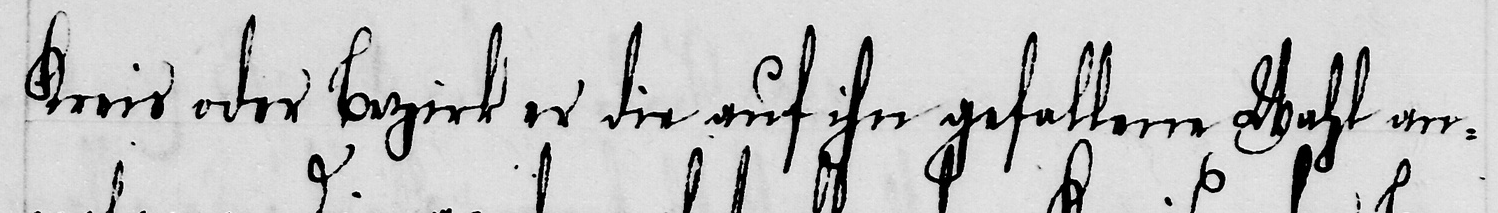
Kreis oder Bezirk er die auf ihn gefallene Wahl an¬
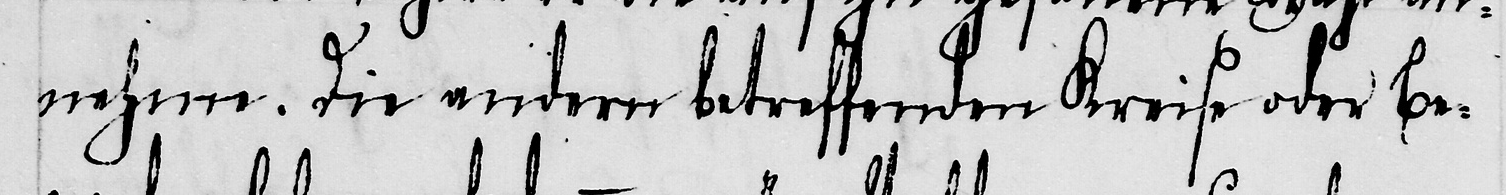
nehme. Die andern betreffenden Kreise oder Be¬
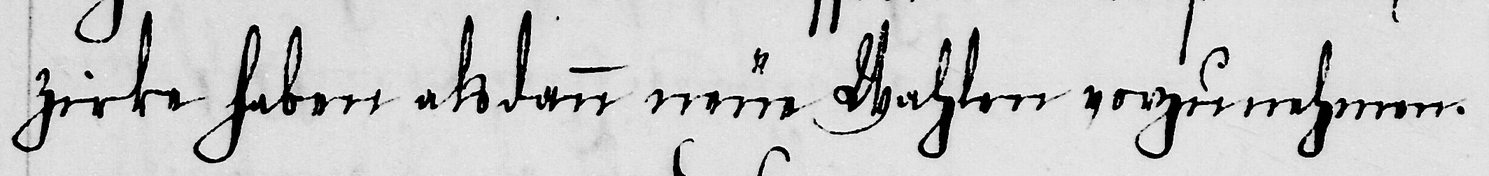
zirke haben alsdann neue Wahlen vorzunehmen.
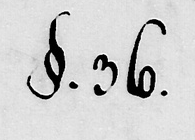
§. 36.
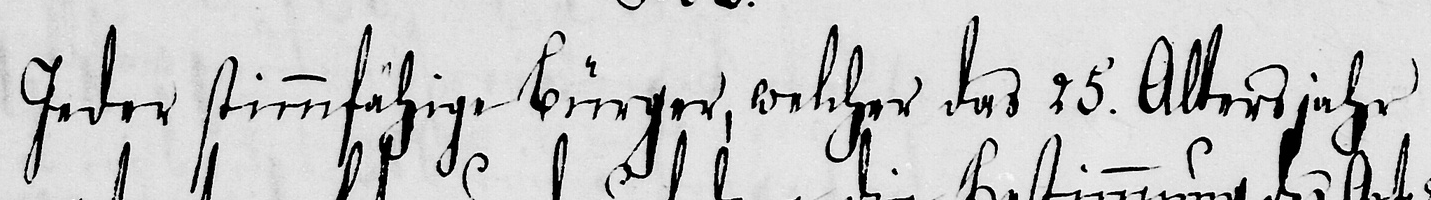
Jeder stimmfähige Bürger, welcher das 25. Altersjahr
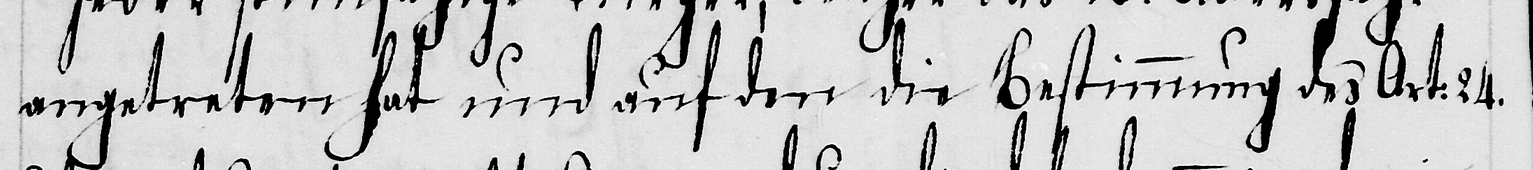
angetreten hat und auf den die Bestimmung des Art: 24.
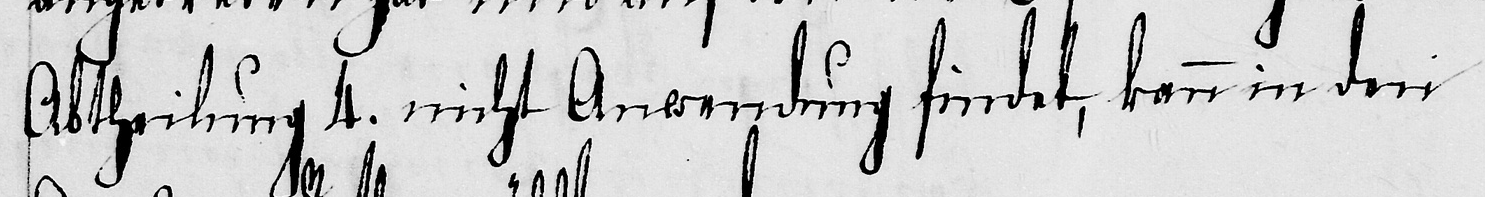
Abtheilung 4. nicht Anwendung findet, kann in den
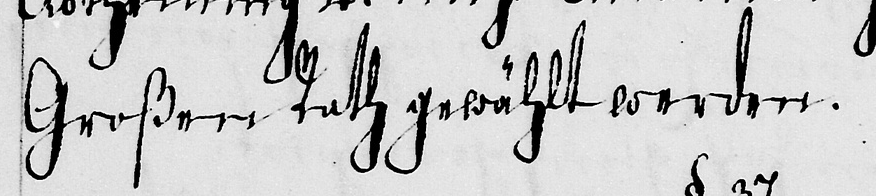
Großen Rath gewählt werden.
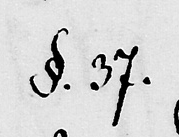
§. 37.
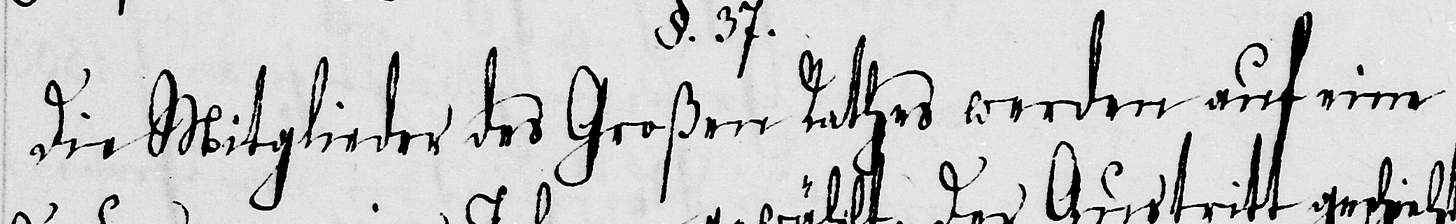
Die Mitglieder des Großen Rathes werden auf eine
